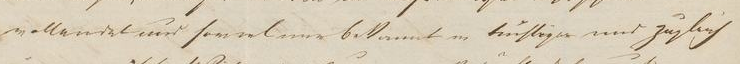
vollendet und soweit mir bekannt in tüchtiger und zugleich
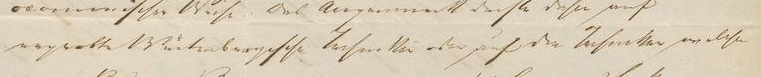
erprobte Würtenbergsche Techniker oder auf die Techniker welche
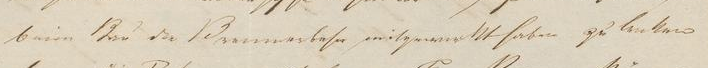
beim Bau der Brennerbahn mitgewirkt haben zu lenken
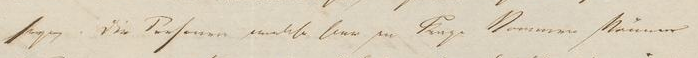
seyn. Die Personen welche hier in Frage kommen können
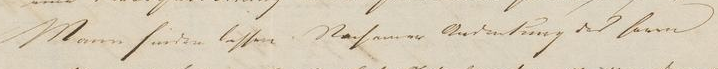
Mann finden lassen. Nach einer Andeutung des Herrn
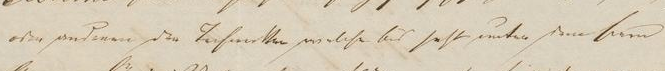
oder anderen der Techniker welche bis jetzt unter dem Herrn
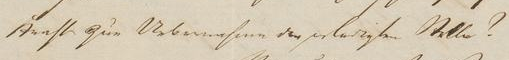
Kraft zur Uebernahme der erledigten Stelle?
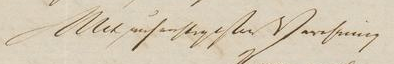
Mit aufrichtigster Verehrung
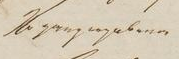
Ihr ganz ergebener
